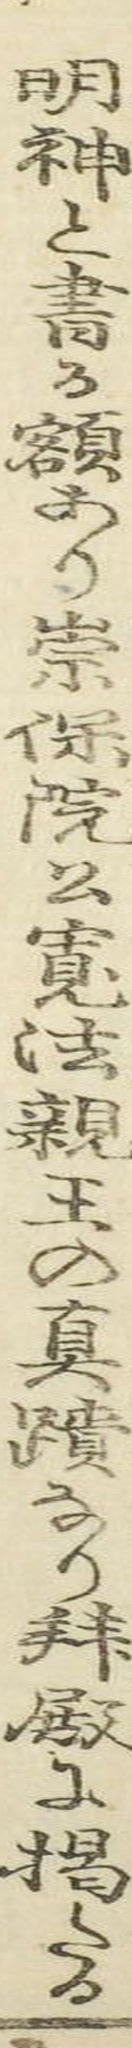明神と書る額あり崇保院公寛法親王の真蹟なり拝殿に掲たる
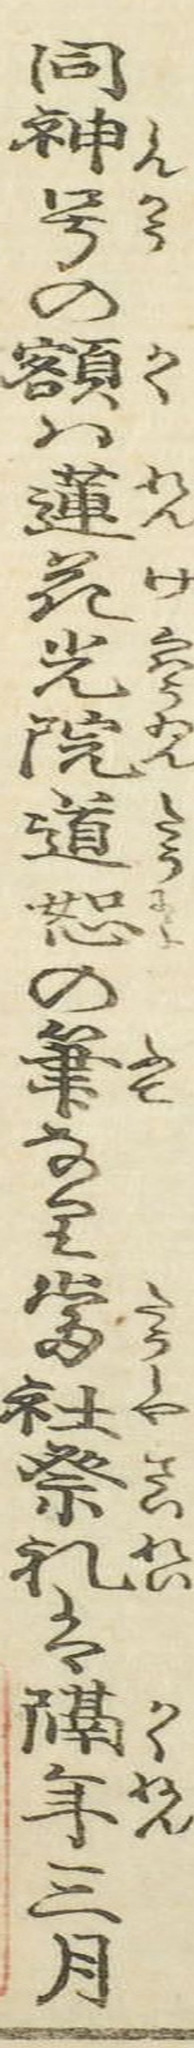同神号の額は蓮花光院道恕の筆なり当社祭礼は隔年三月
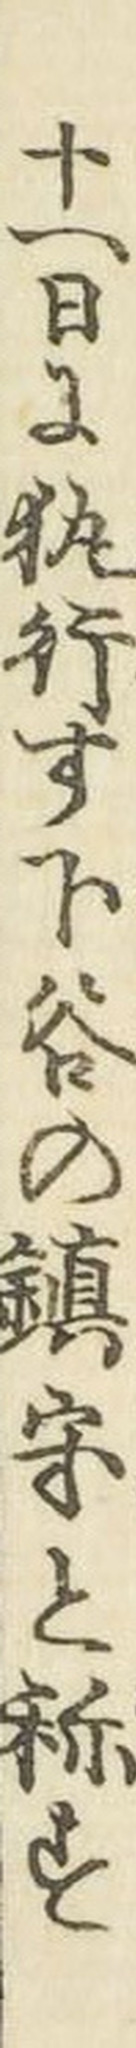十一日に執行す下谷の鎮守と称す
